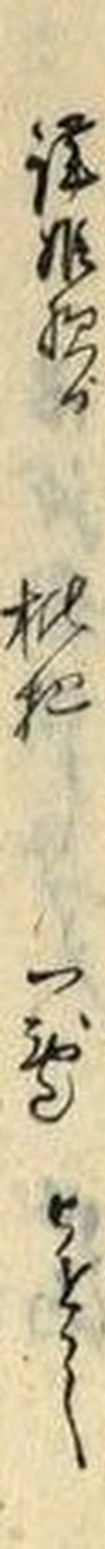謹姫様ゟ枇杷一台被進之
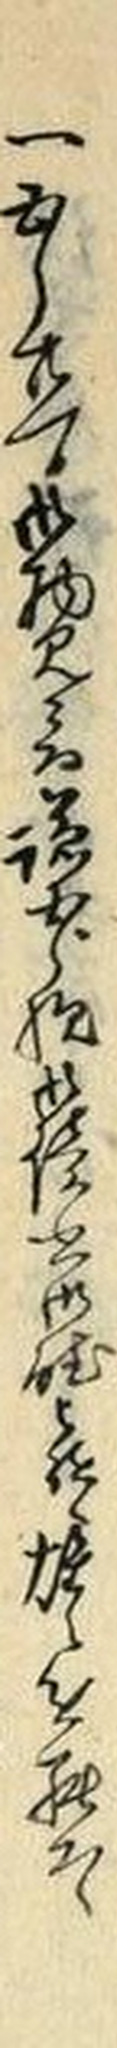一五月廿一日御物見ニ而謙五郎様御読書御聞被遊候雄之進罷出候
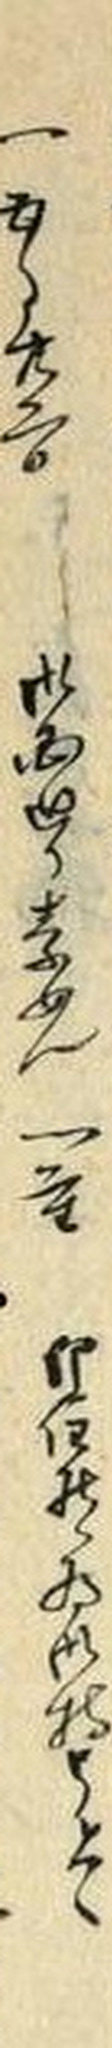一五月廿二日御国廻り素めん一重御住居へ為御持被進候
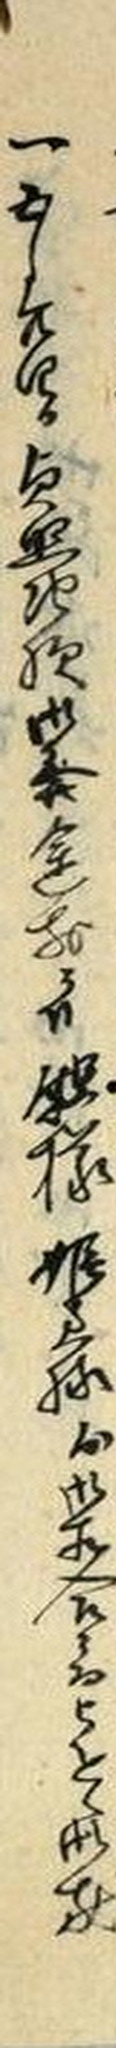一五月廿四日貞照院様御発途前ニ付殿様姫君様ゟ御相合ニ而被進候御献
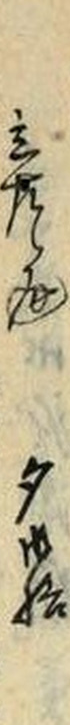立左之通夕御膳

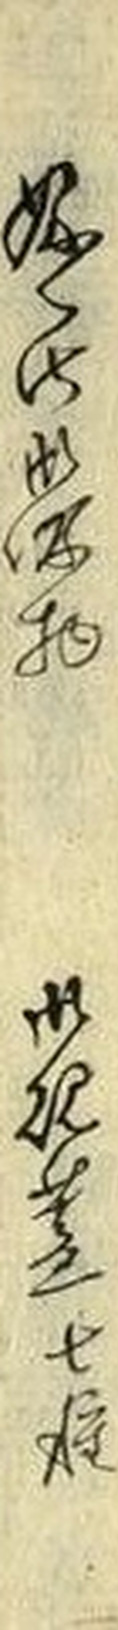ふた付御吸物御硯蓋七種
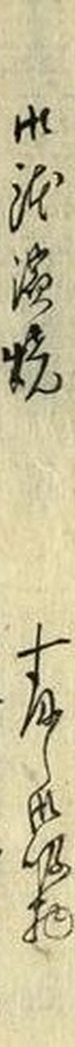御鉢浜焼すまし御吸物
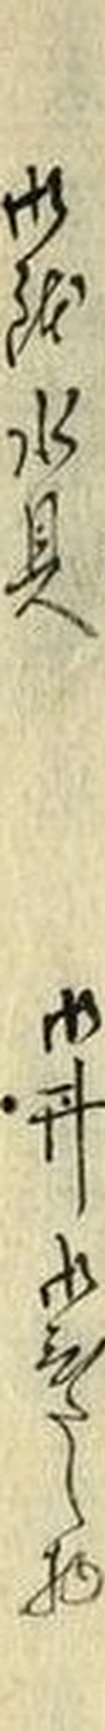御鉢水具御丼御ひたし物
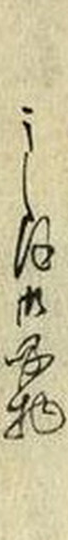うしほ御吸物
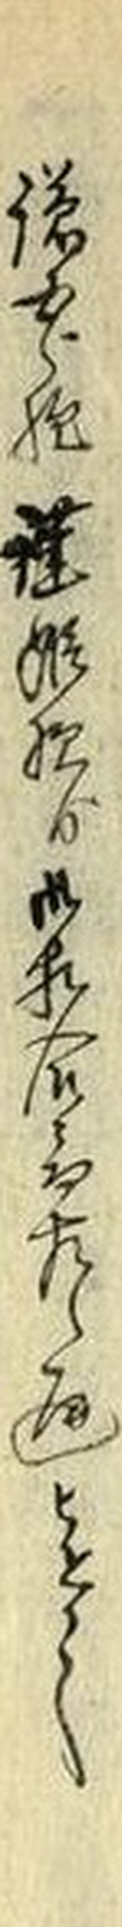謙五郎様謹姫様ゟ御相合ニ而左之通被進之
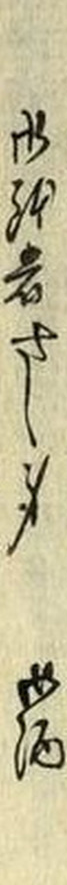御鉢肴さし身御酒
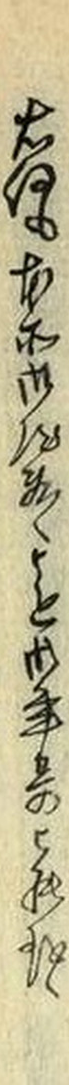右何も本所御屋敷へ被進御年寄被罷越候
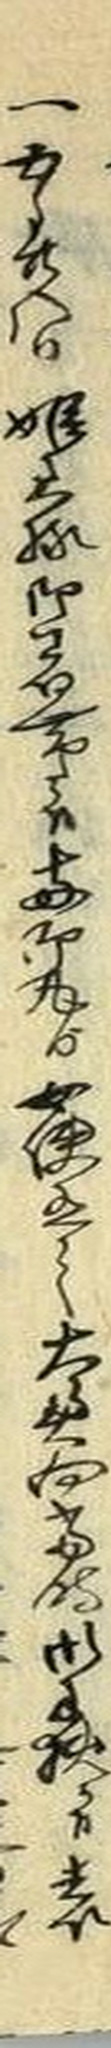一五月廿八日姫君様御着帯ニ付両御丸ゟ女使有之大奥向当時御手狭ニ付表
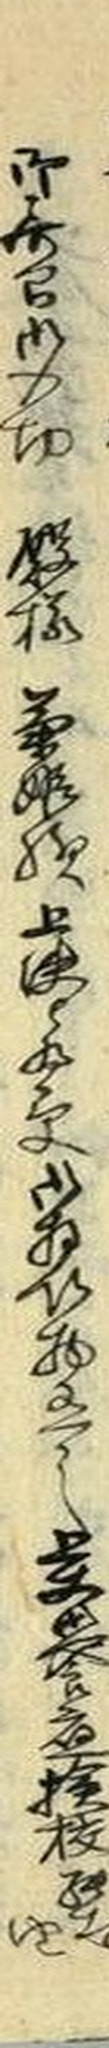御居間御〆切殿様菊姫様上使被為受御拝領物有之上使御饗応検校罷出候由
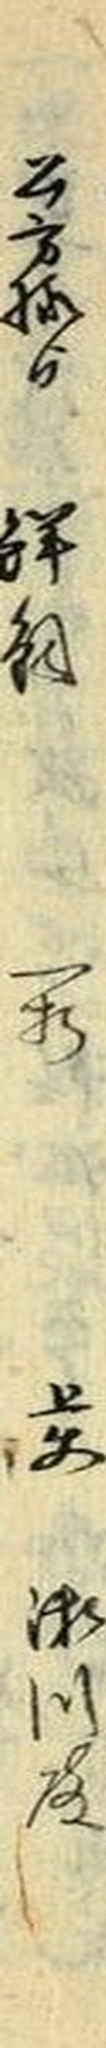公方様ゟ鮮鯛一折上使瀬川殿
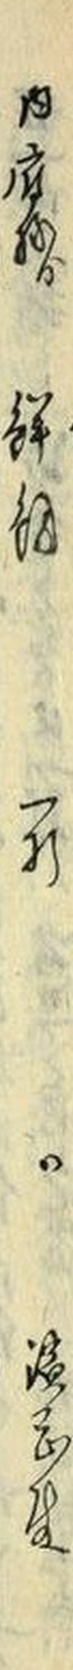内府様ゟ鮮鯛一折同浜岡殿
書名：少傅日録抄（斉承付側向頭取日記、在府）
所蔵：福井県文書館 Fukui Prefectural Archives
